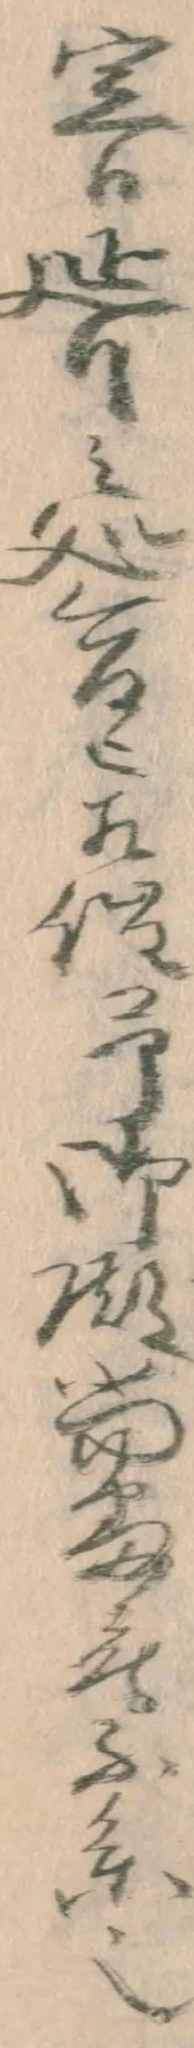定日延引之処今日被相催予御殿當番ニ付不参也
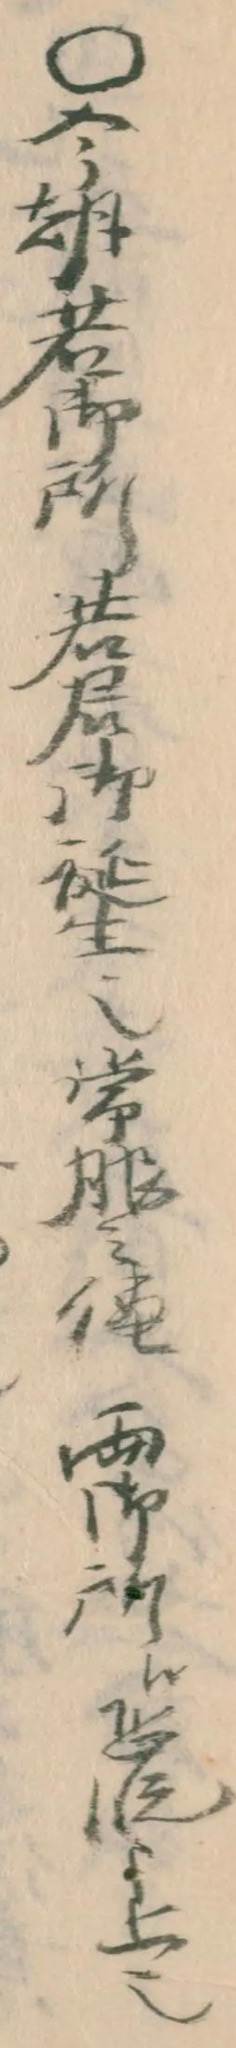○今朝若御所若君御誕生也常服之侭両御所え恐悦申上也
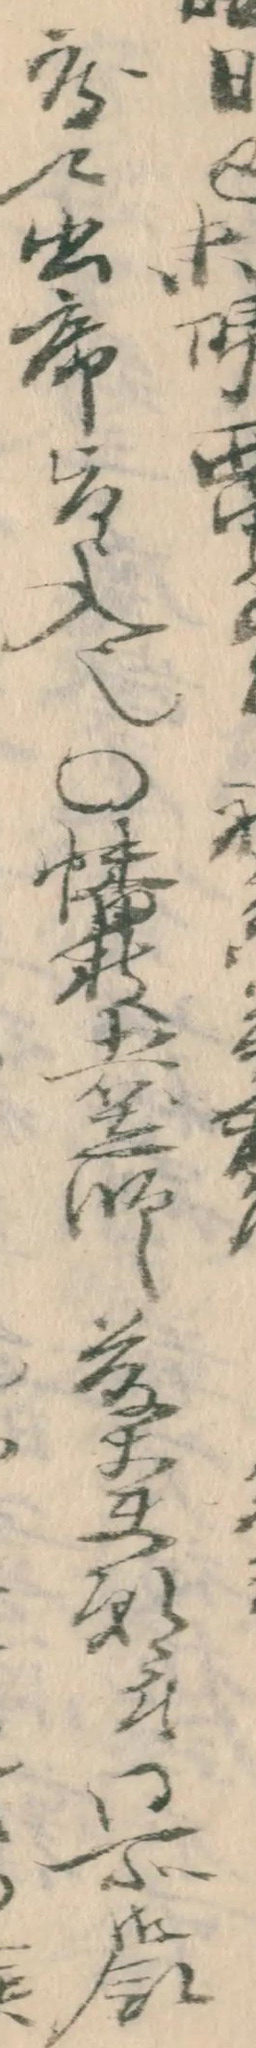度可出席旨申入也○幡枝土笠師藤大夫願ニ付同所御領
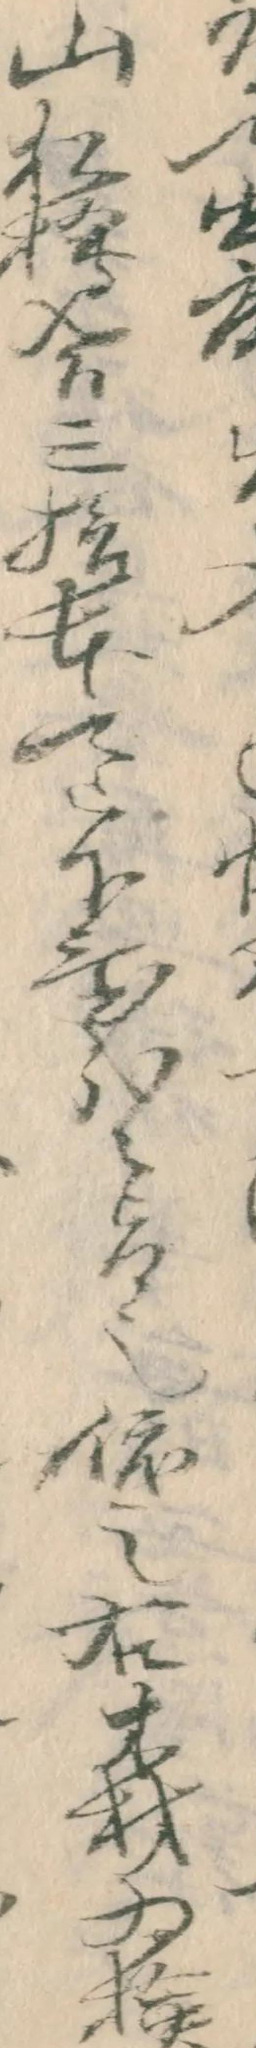山松檜今日三拾本可被下置候哉之旨也依之右木材為検
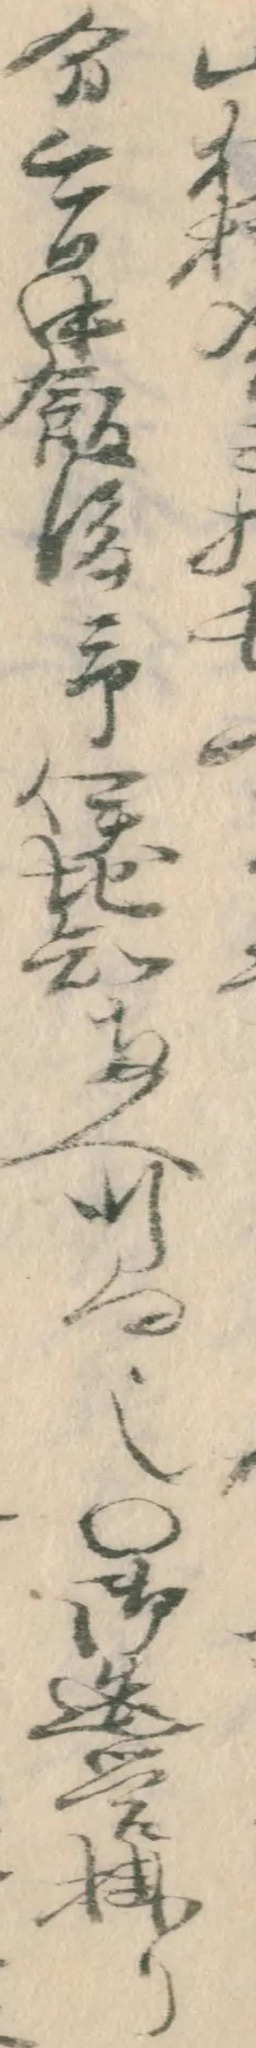分今日中飯後予伊地知両人行向也○御造営掛リ
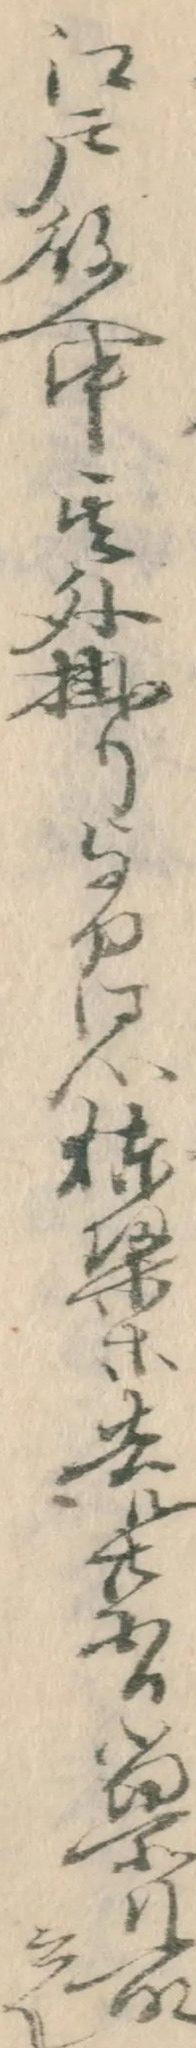江戸役人中其外掛り与力同心棟梁等去ル廿五日両所引故云々
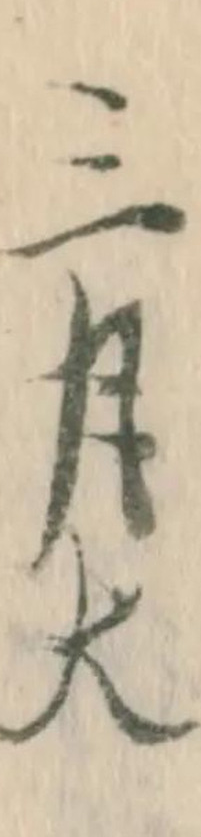三月大
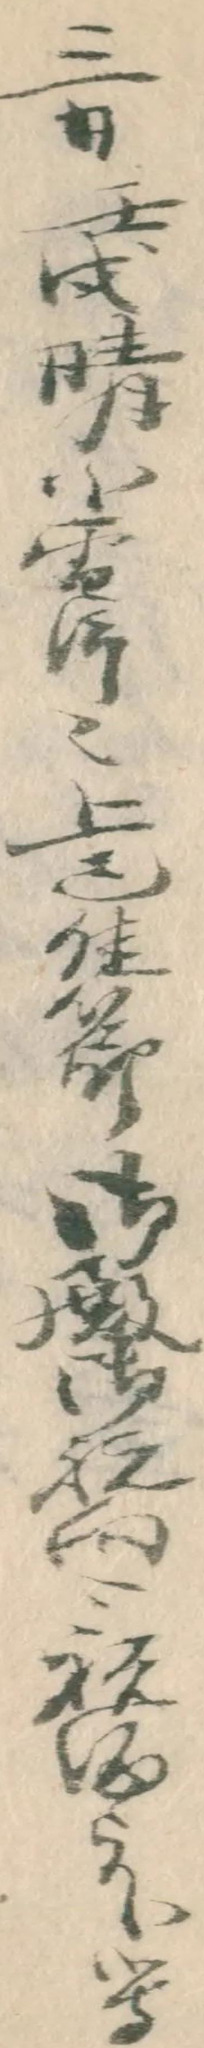三日壬戌晴小雪添也上巳佳節御殿御祝向御祝酒被下等
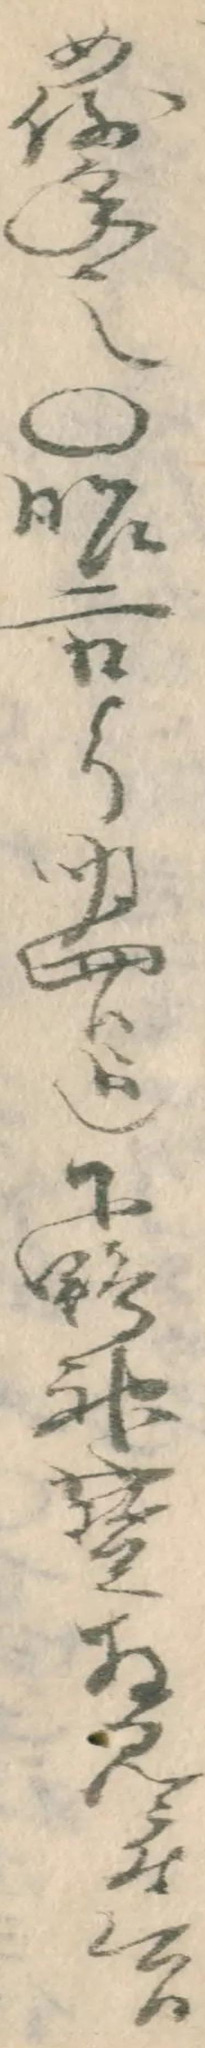如例年也○昨二日より明四日迄下鴨神寶拝見二付今日
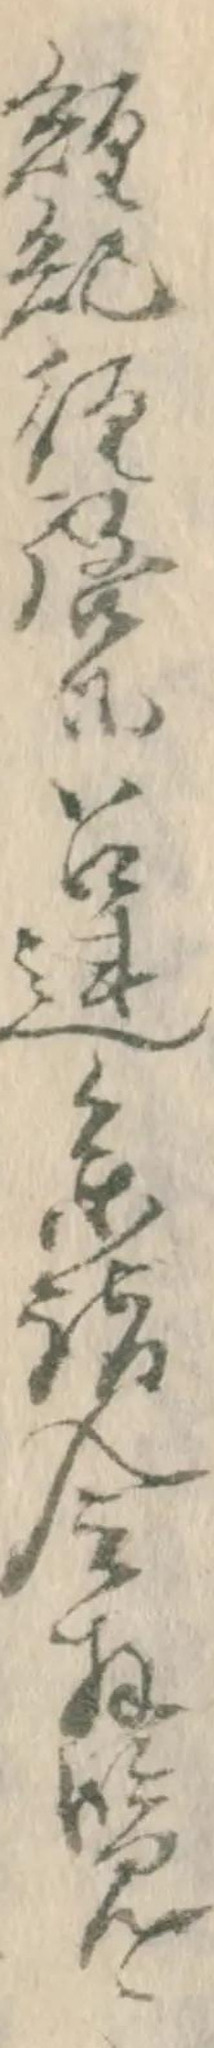経紀経啓等召連参詣会拝覧也
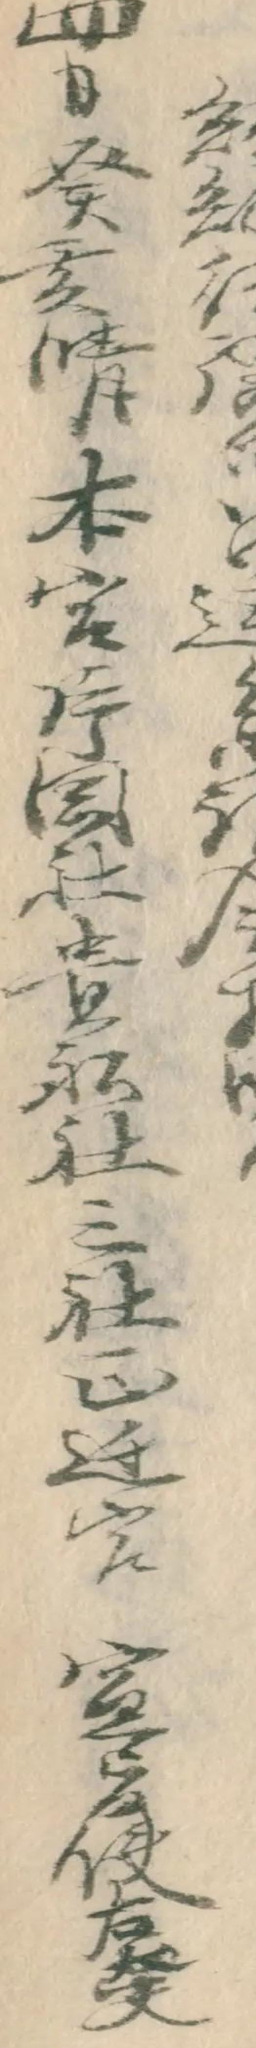四日癸亥晴本宮片岡社貴舩社三社正遷宮宣旨使右大史

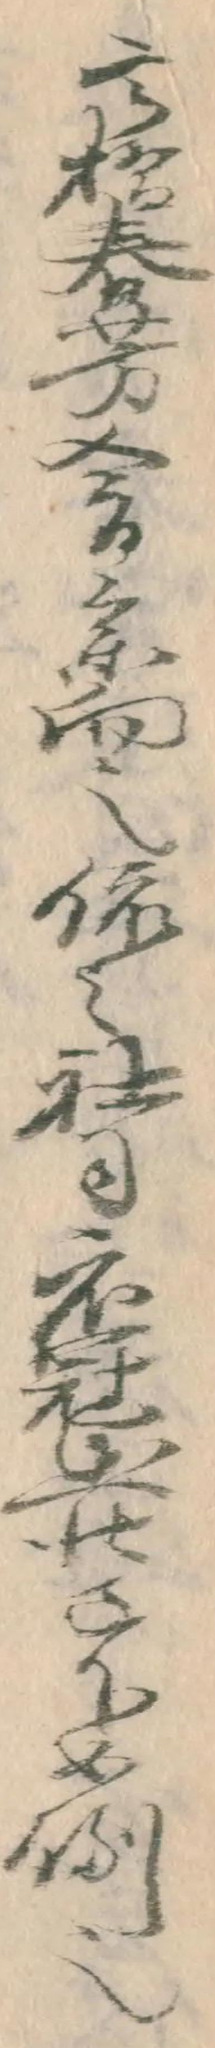高橋春芳今日参向也依之社司衣冠出仕已下如例也
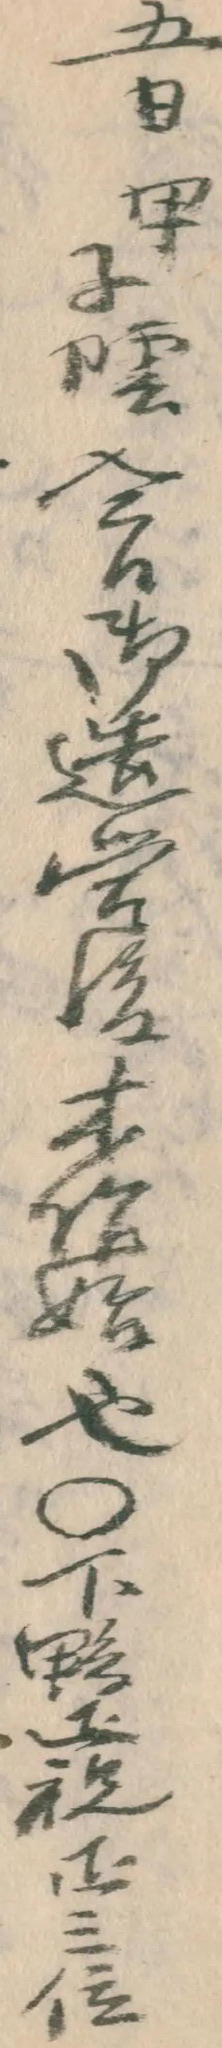五日甲子曇今日御造営後木始始也○下鴨御祝正三位
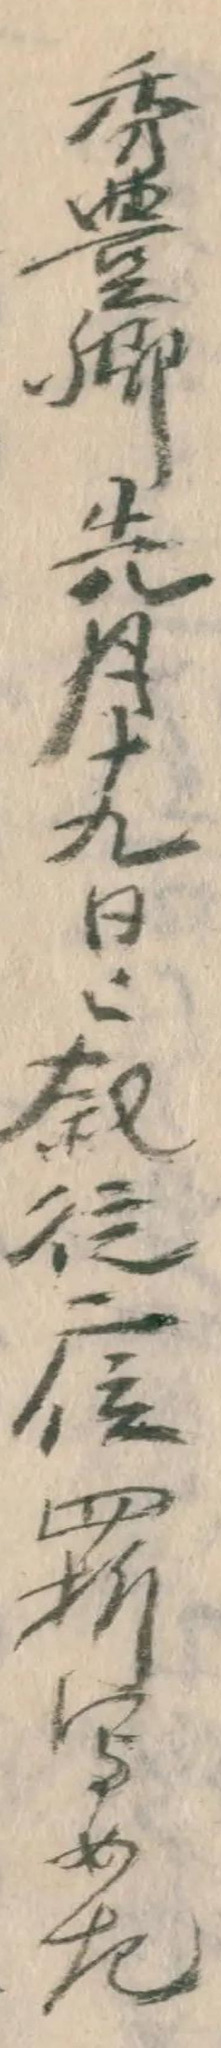秀豊卿先月十九日被叙従二位四折写如左
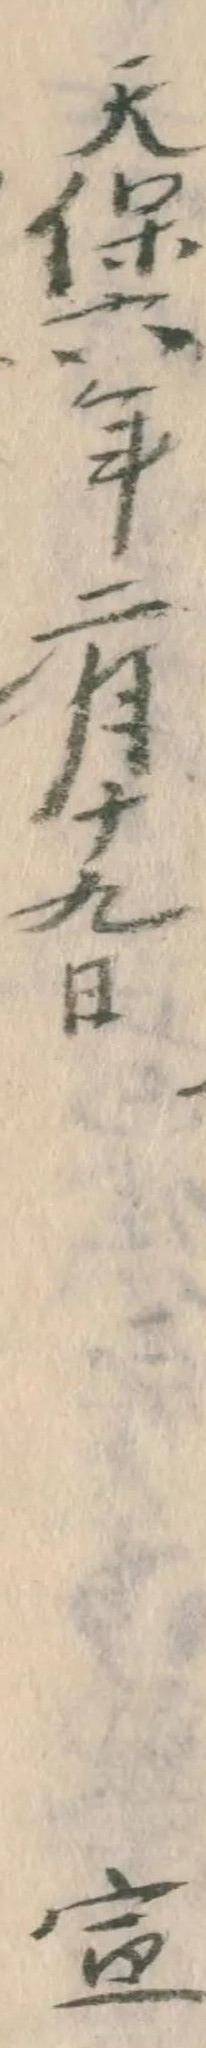天保六年二月十九日宣
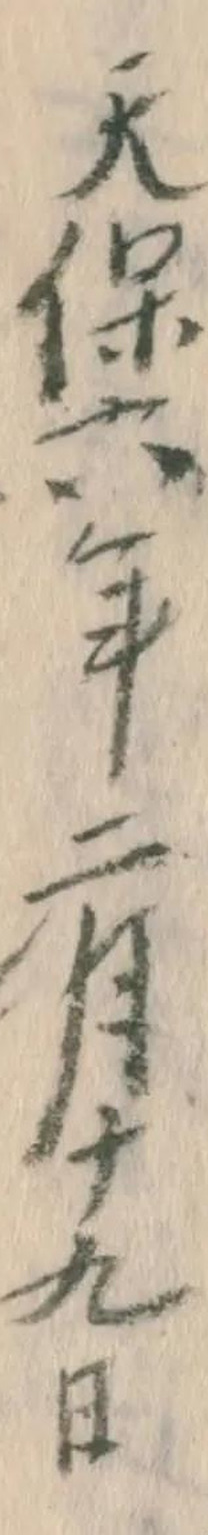天保六年二月十九日宣
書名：賀茂社記録. 第67冊
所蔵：国立国会図書館 National Diet Library, JAPAN
